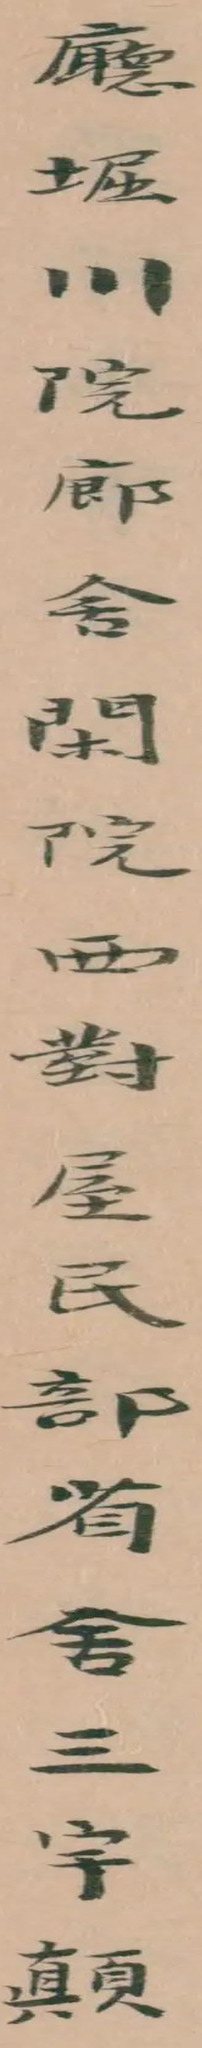庁堀河院廊舎閑院西対屋民部省舎三宇顛
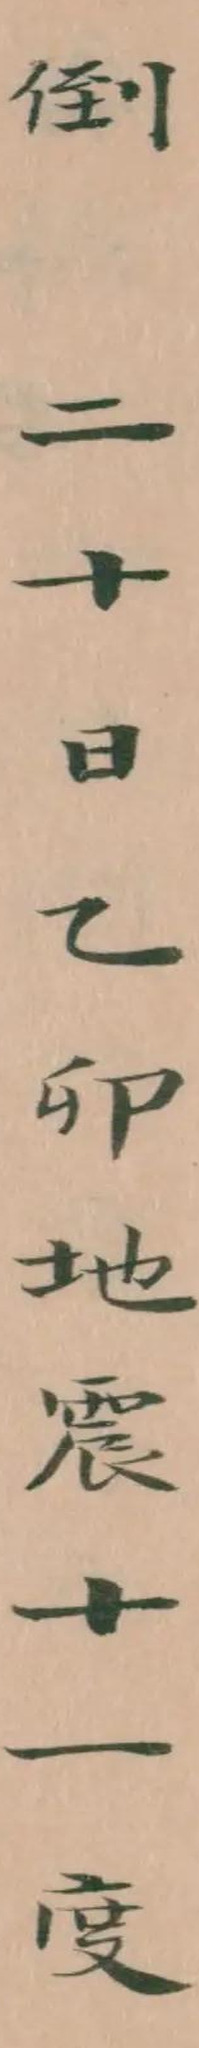倒二十日乙卯地震十一度
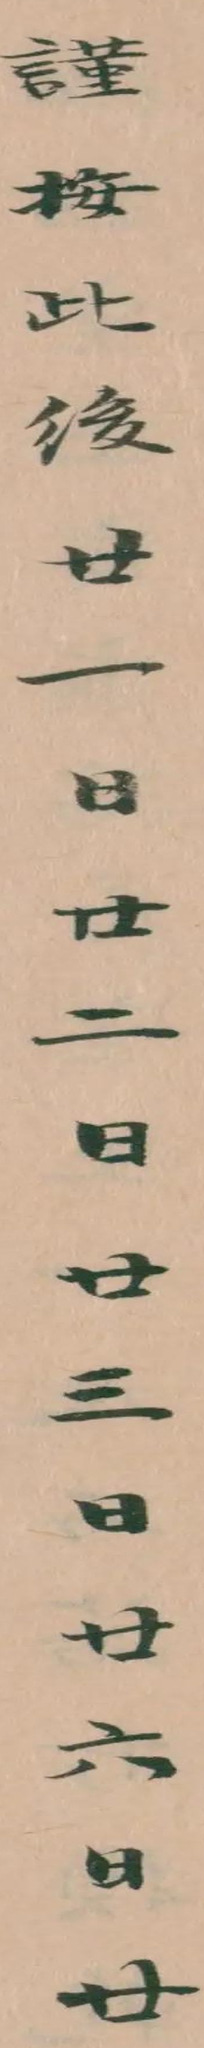謹按此後廿一日廿二日廿三日廿六日廿
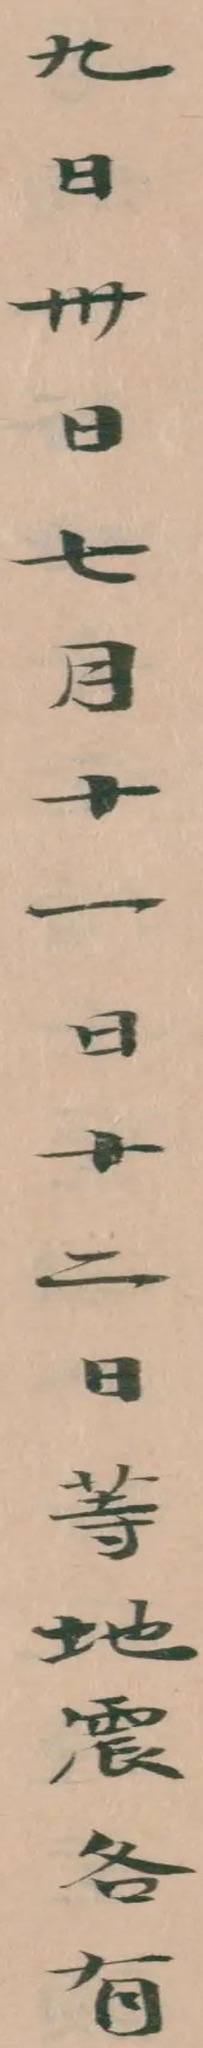九日卅日七月十一日十二日等地震各有
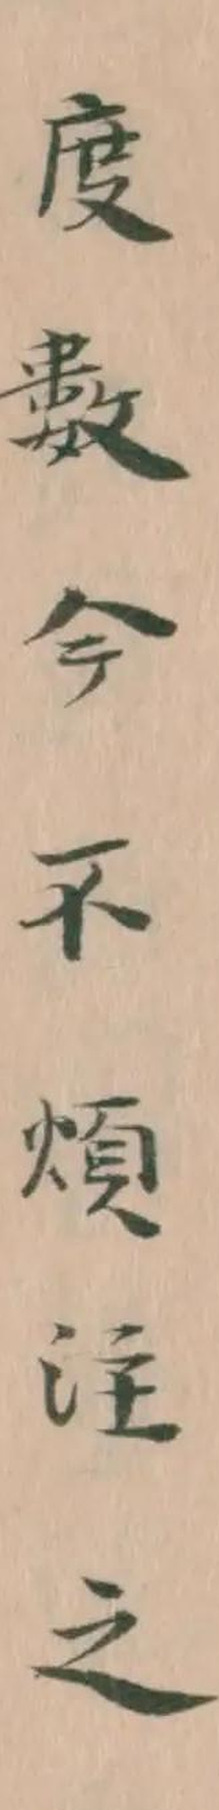度数今不煩注之
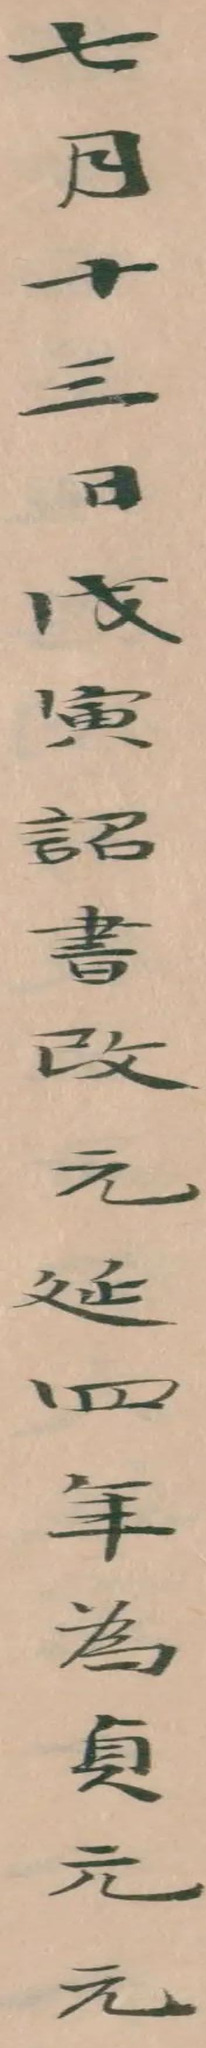七月十三日戊寅詔書改元延四年為貞元元
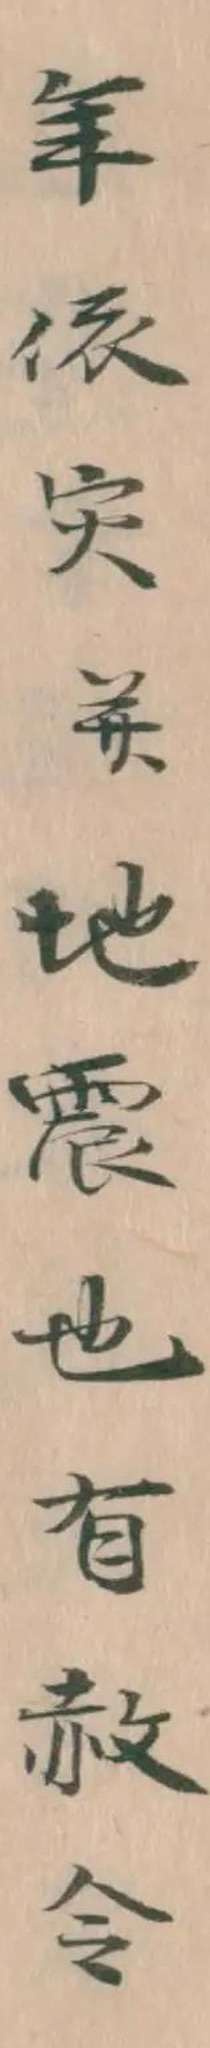年依灾幷地震也有赦令
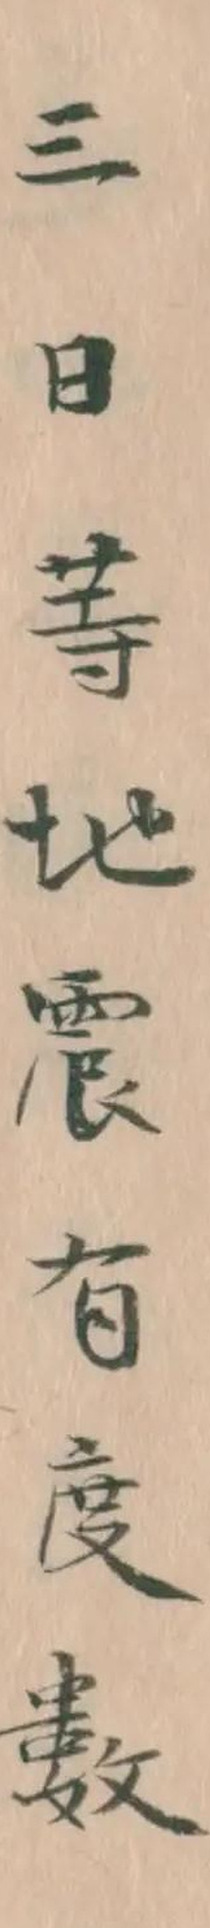三日等地震有度数
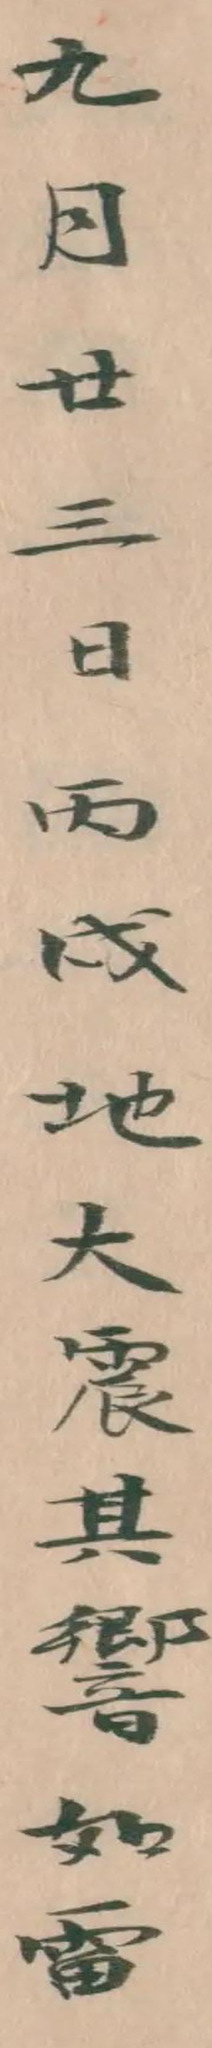九月廿三日丙戌地大震其響如雷
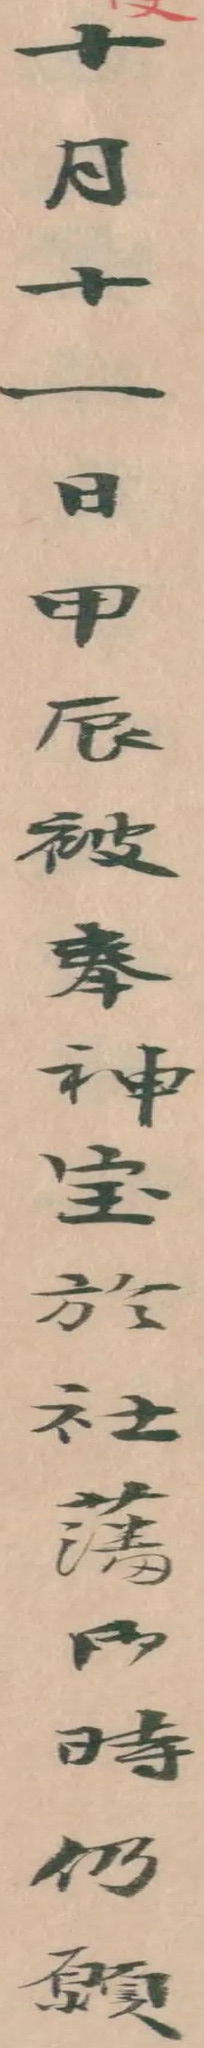十月十一日甲辰被奉神宝於社藩御時仍願

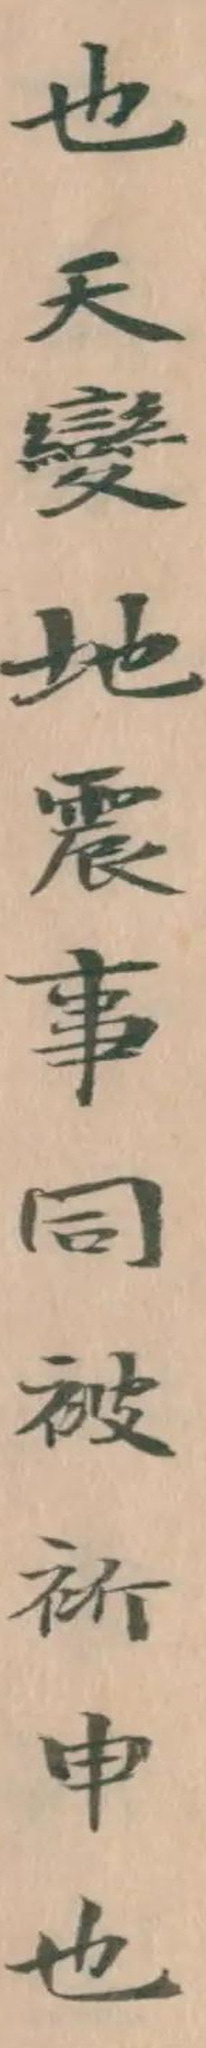也天変地震事同被祈申也
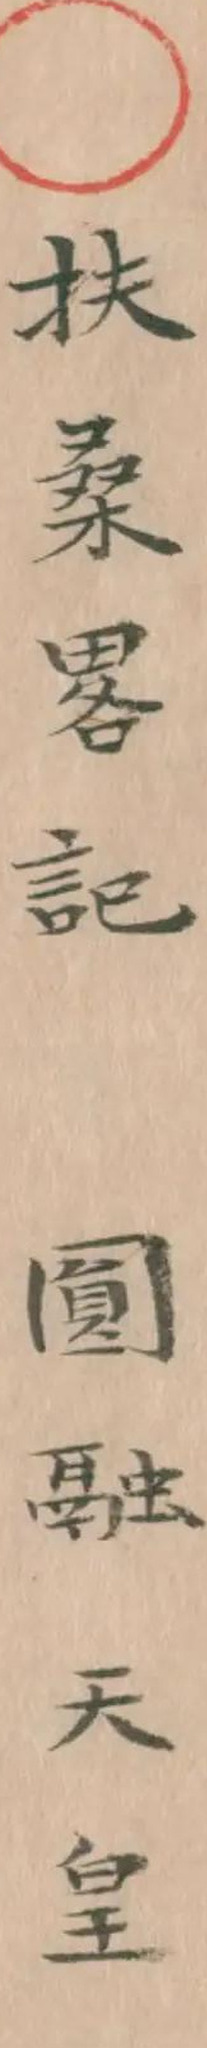○扶桑略記円融天皇
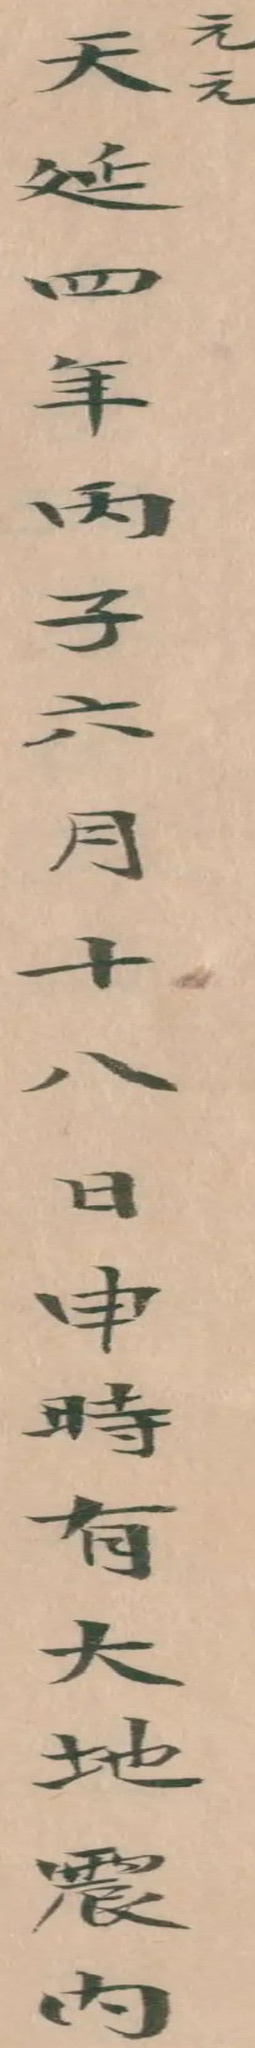天延四年丙子六月十八日申時有大地震内
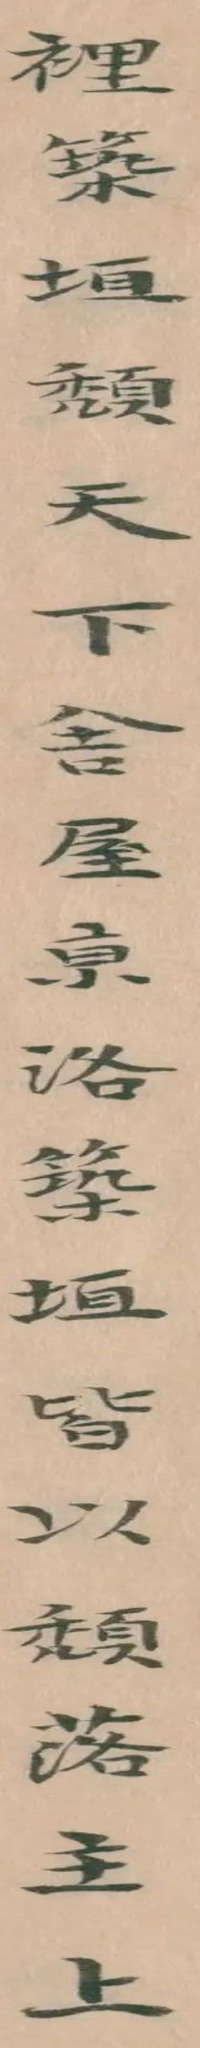裏築垣頽天下舎屋京洛築垣皆以頽落主上
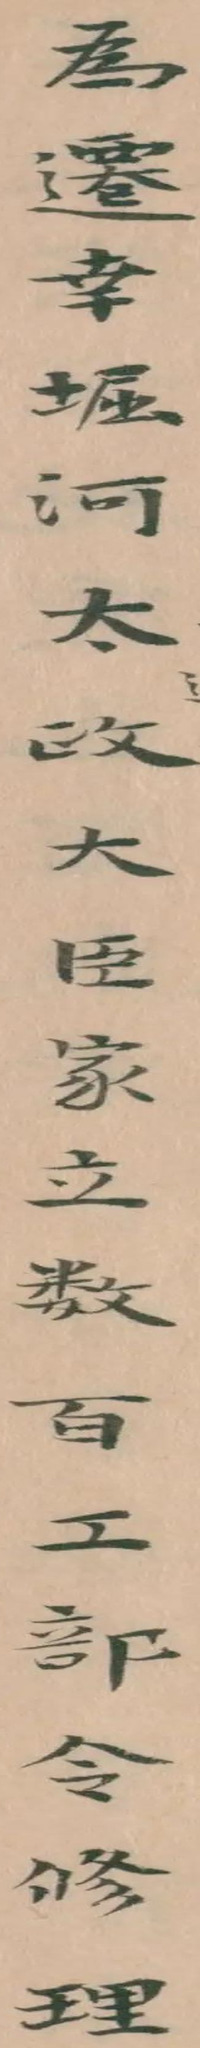為遷幸堀河太政大臣家立数百工部令修理
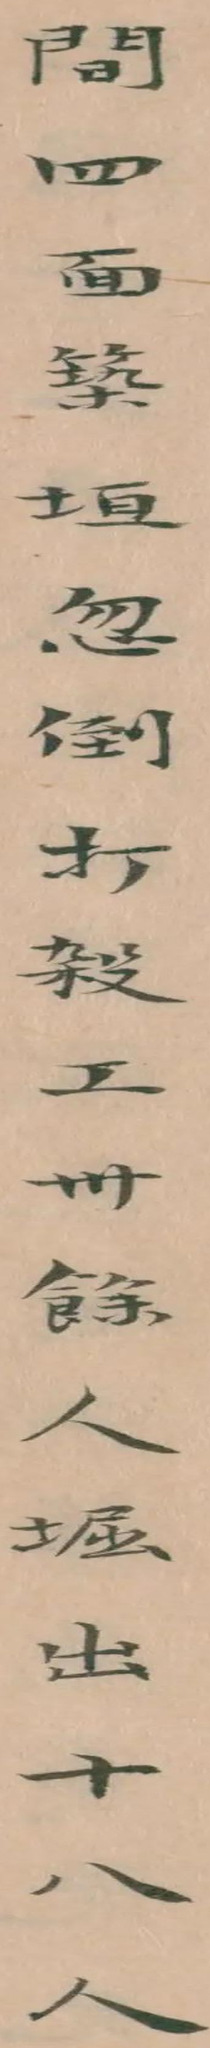間四面築垣忽倒打殺工卅余人堀出十八人
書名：地災撮要. 巻5-6(地震之部)
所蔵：国立国会図書館 National Diet Library, JAPAN
